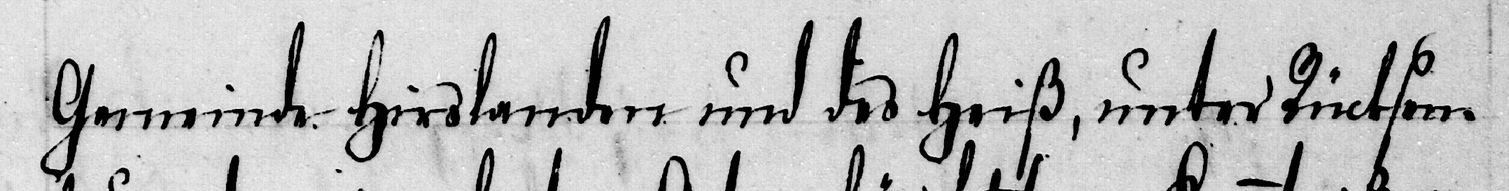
Gemeinde Hirslanden und des Heiß, unter Rücksen¬
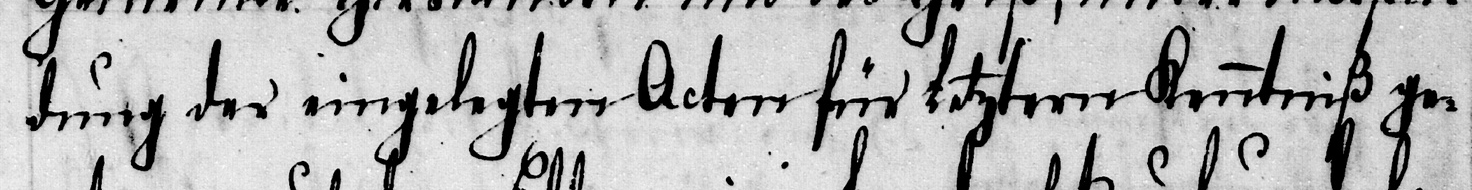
dung der eingelegten Acten für Letztern Kenntniß ge¬
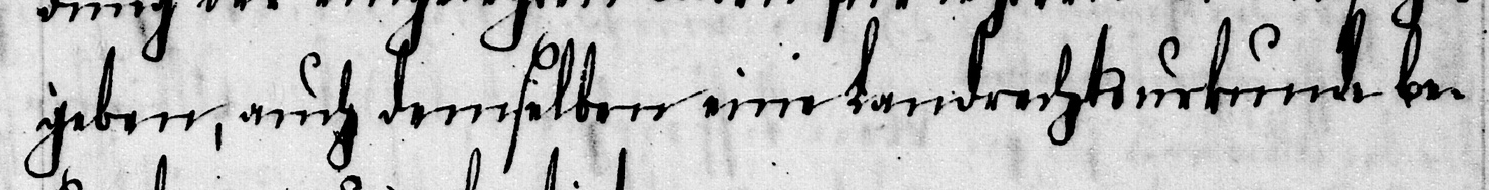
geben, auch demselben eine Landrechtsurkunde be¬
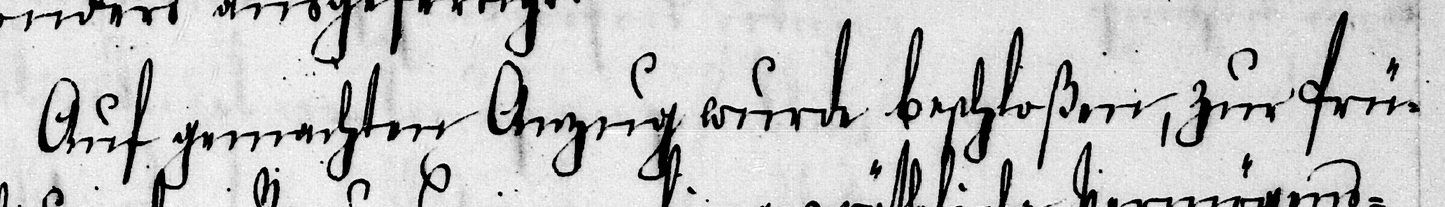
Auf gemachten Anzug wurde beschloßen, zur Prü¬
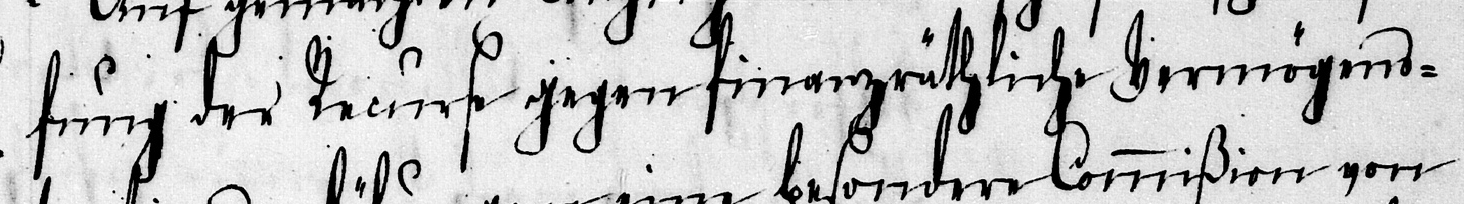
fung der Recurse gegen finanzräthliche Vermögens¬
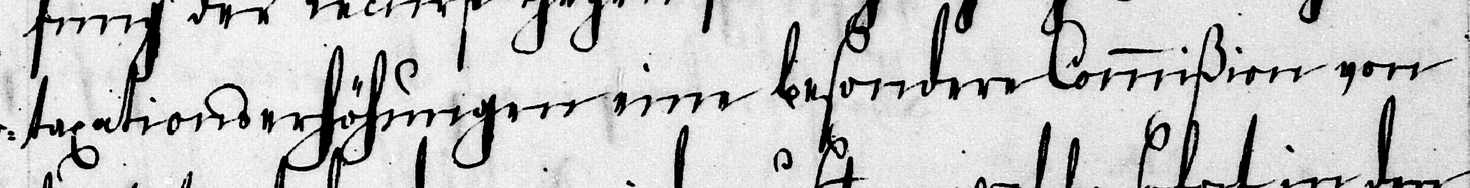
taxationserhöhungen eine besondere Commißion von
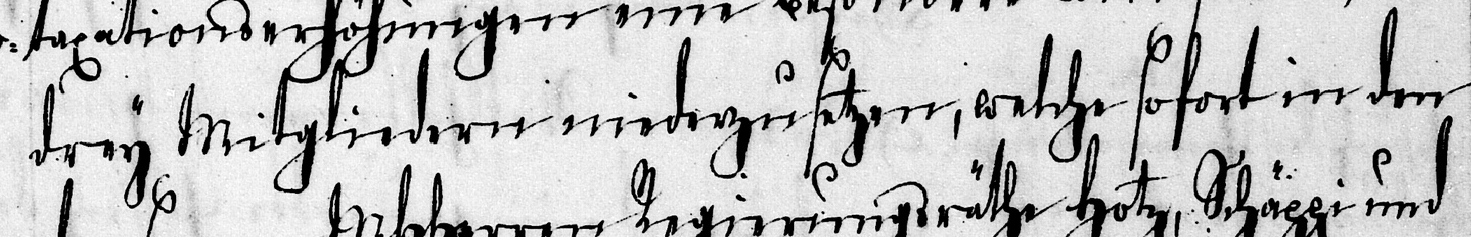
drey Mitgliedern niederzusetzen, welche sofort in den
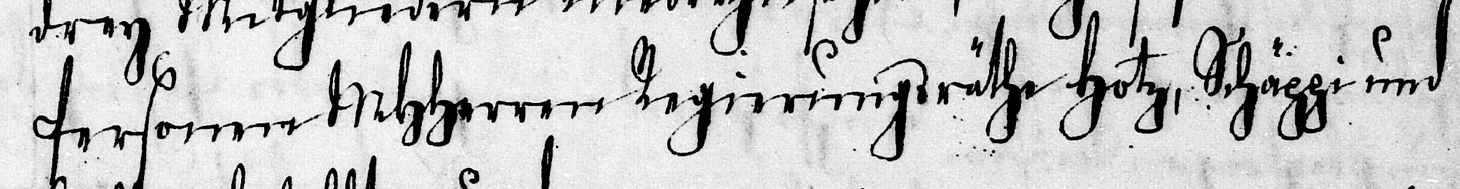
Personen MHHerren Regierungsräthe Hotz, Schäppi und
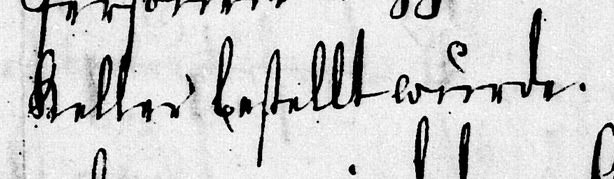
Keller bestellt wurde.
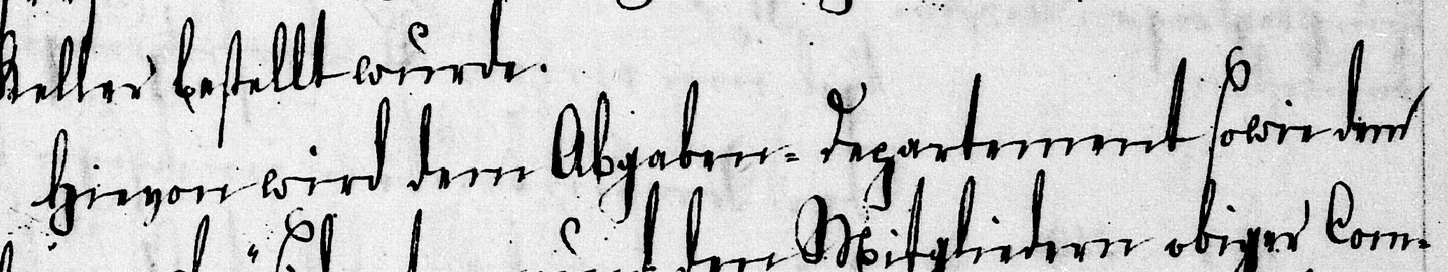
Hievon wird dem Abgaben-Departement sowie dem
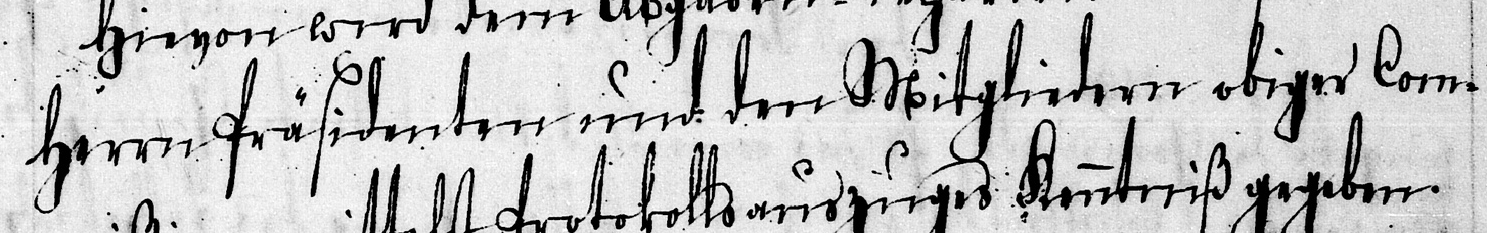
Herrn Präsidenten und den Mitgliedern obiger Com¬
